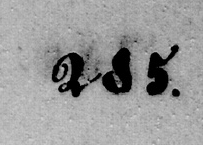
20.
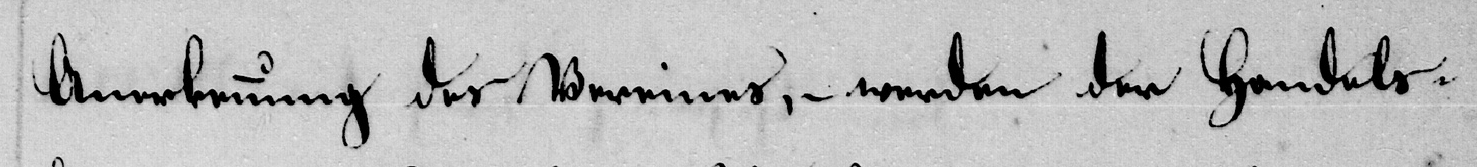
Anerkennung des Vereines, – werden der Handels¬
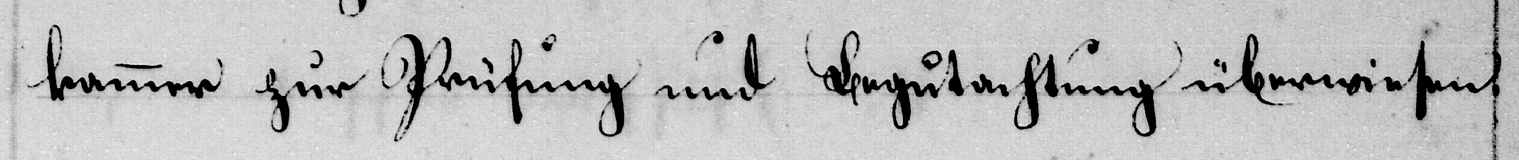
kammer zur Prüfung und Begutachtung überwiesen.
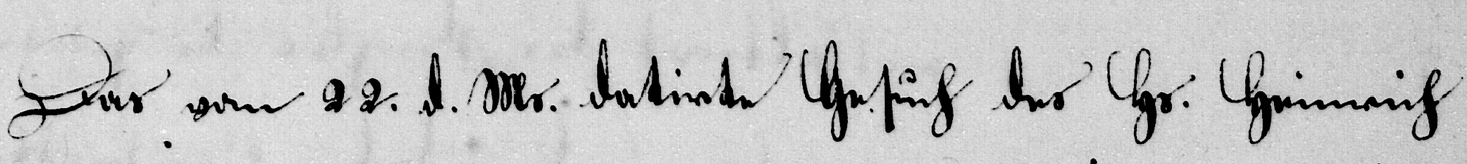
Das vom 22. d. Ms. datirte Gesuch des Hs. Heinrich
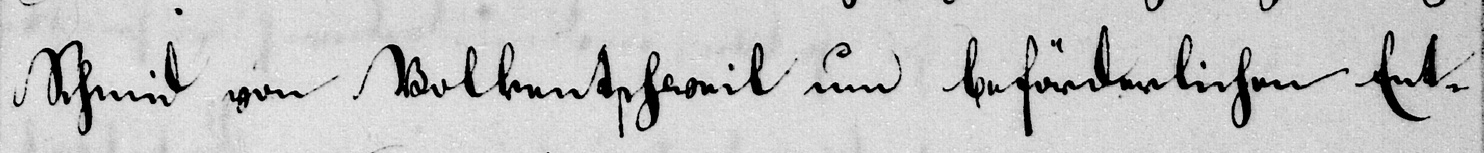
Schmid von Volkentschweil um beförderlichen Ent¬
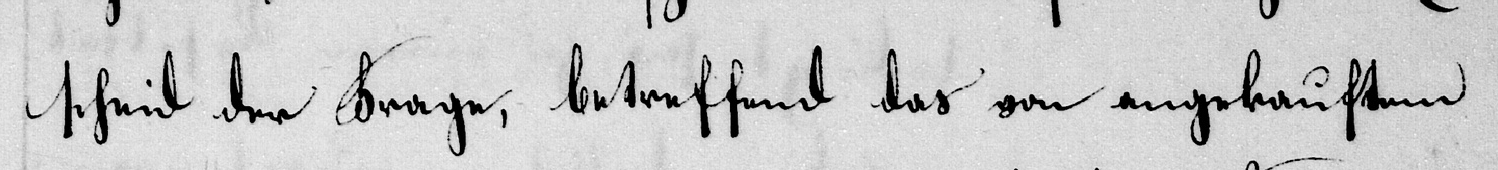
scheid der Frage, betreffend das von angekauftem
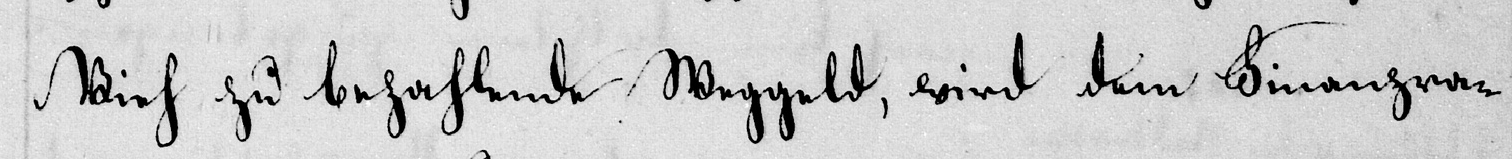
Vieh zu bezahlende Weggeld, wird dem Finanzra¬
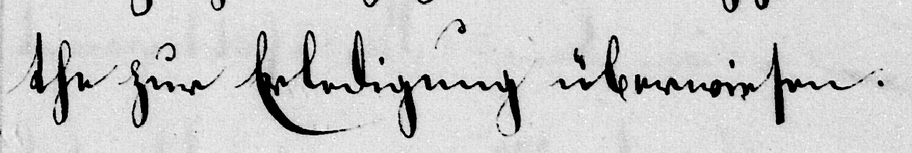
the zur Erledigung überwiesen.
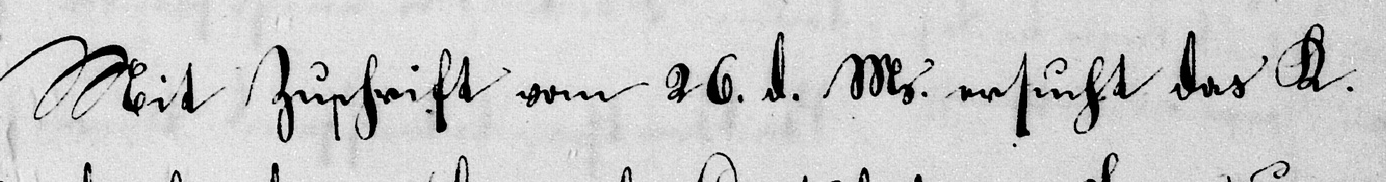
Mit Zuschrift vom 26. d. Ms. ersucht das K.
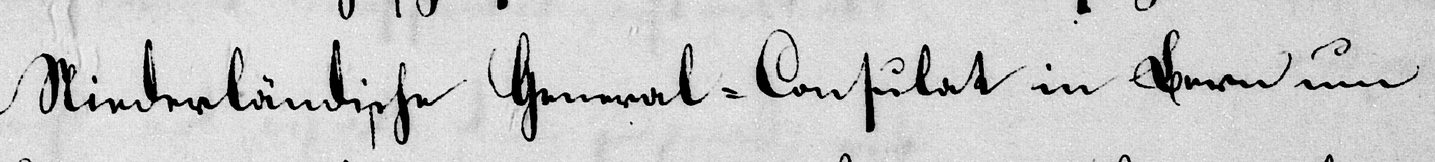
Niederländische General-Consulat in Bern um
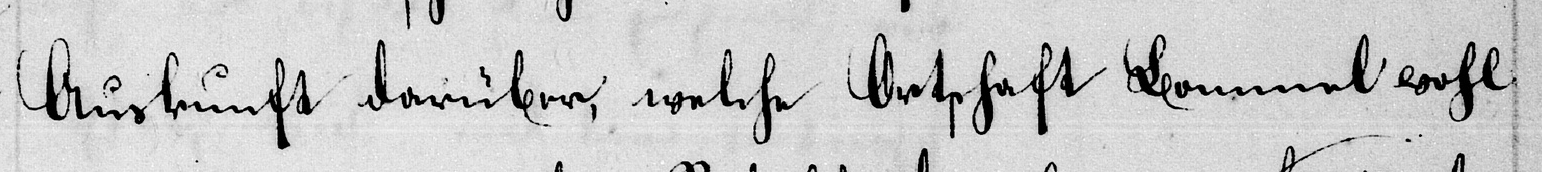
Auskunft darüber, welche Ortschaft Bommel wohl
